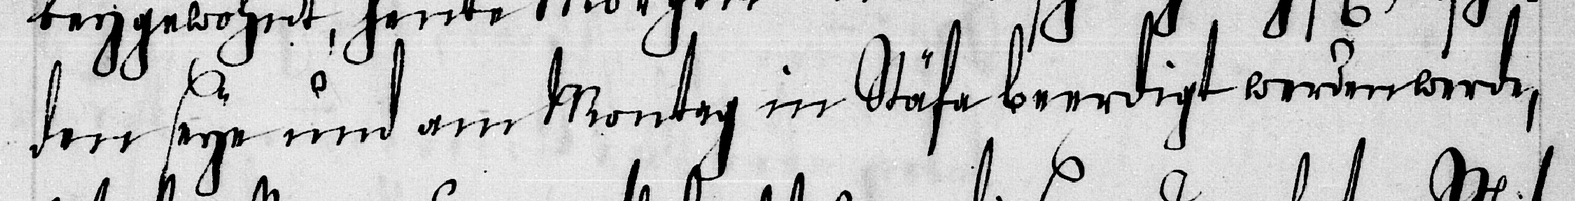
den seye und am Montag in Stäfa beerdigt werden werde,
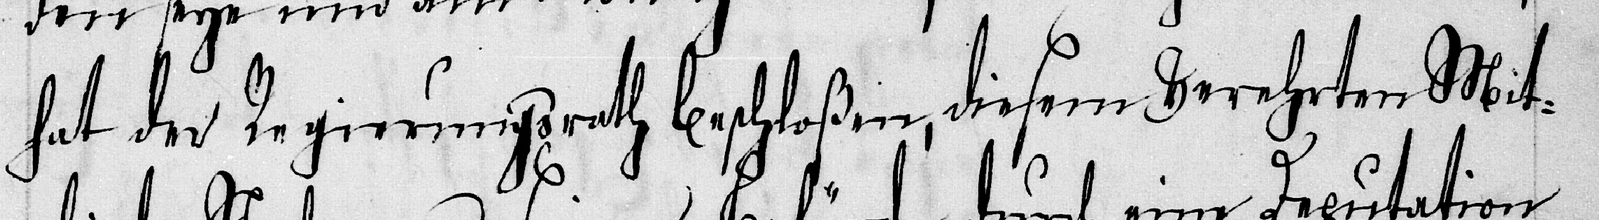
hat der Regierungsrath beschloßen, diesem Verehrten Mit¬
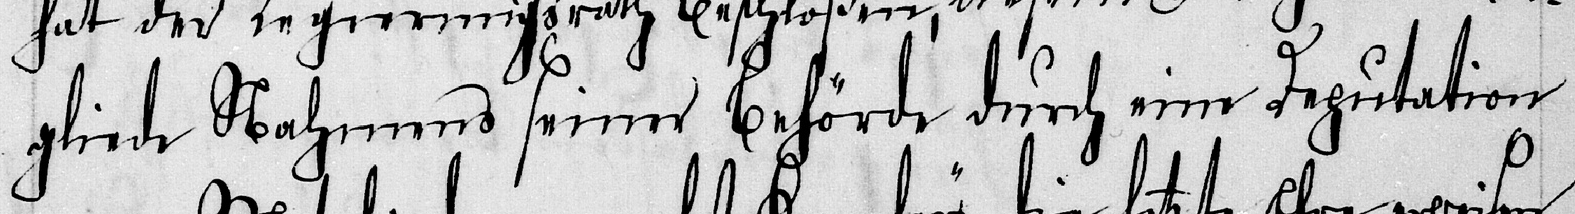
gliede Nahmens seiner Behörde durch eine Deputation
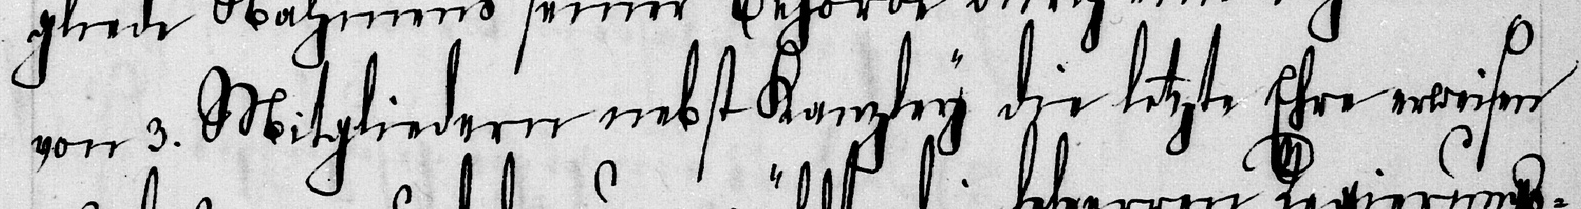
von 3. Mitgliedern nebst Kanzley die letzte Ehre erweisen
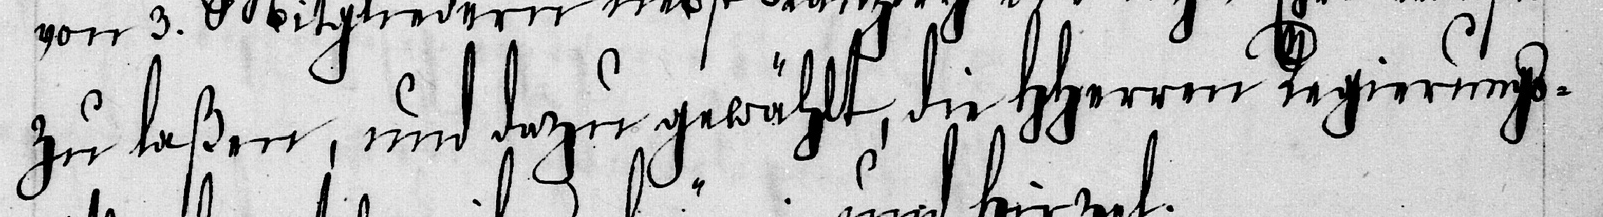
zu laßen, und dazu gewählt, die HHerren Regierungs¬
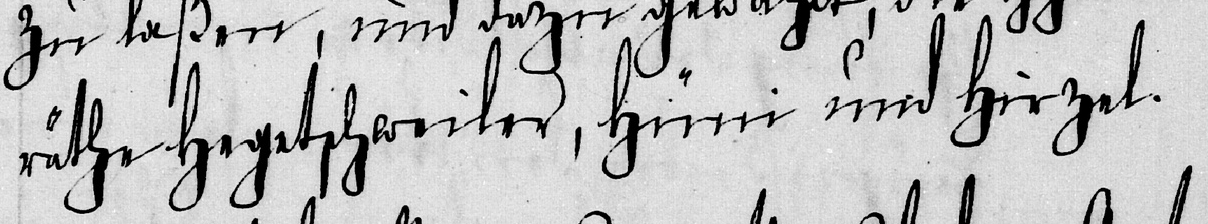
räthe Hegetschweiler, Hüni und Hirzel.
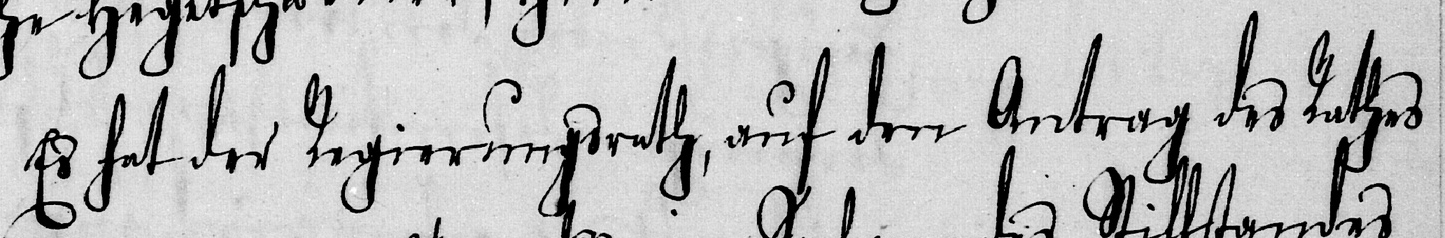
Es hat der Regierungsrath, auf Antrag des Rathes
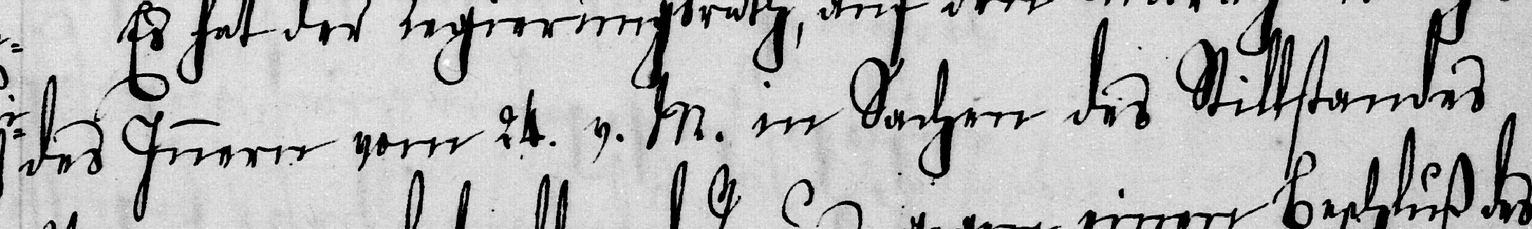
des Innern vom 24. v. M. in Sachen des Stillstandes
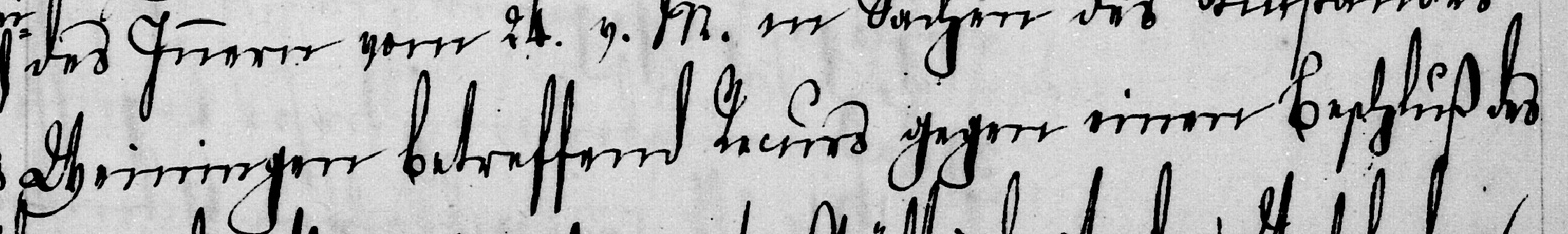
Weiningen betreffend Recurs gegen einen Beschluß des
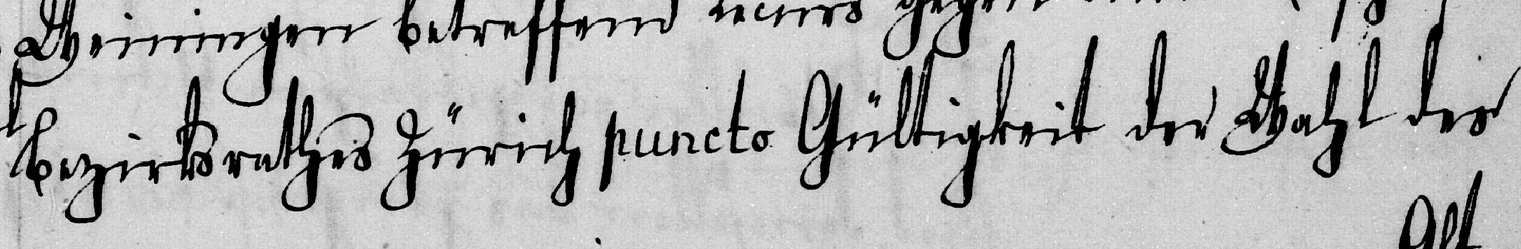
Bezirksrathes Zürich puncto Gültigkeit der Wahl des
